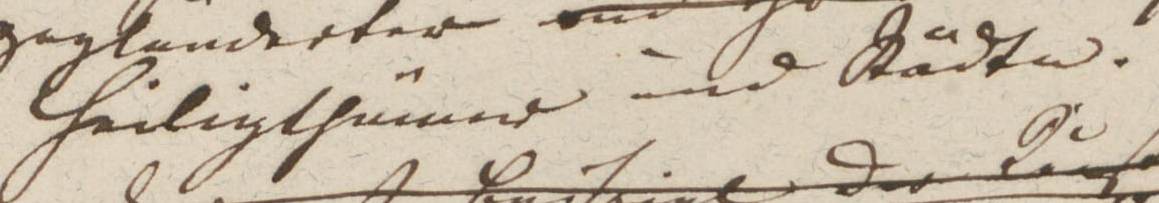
Heiligthümer und Städte.
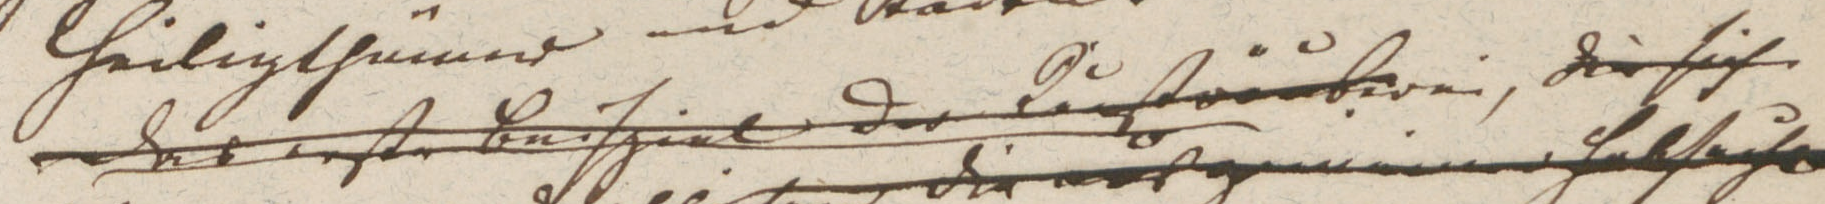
Das erste Beispiel der Kunsträuberei, die sich
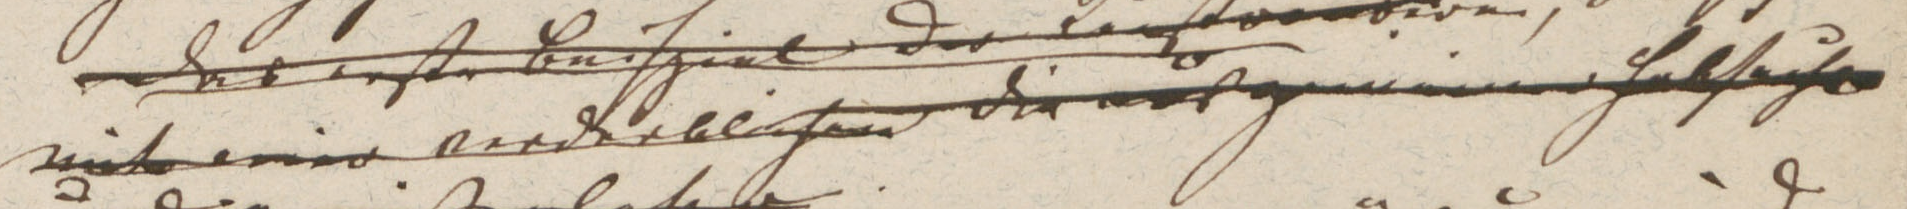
mit einer verderblichen die aus gemeiner Habsucht
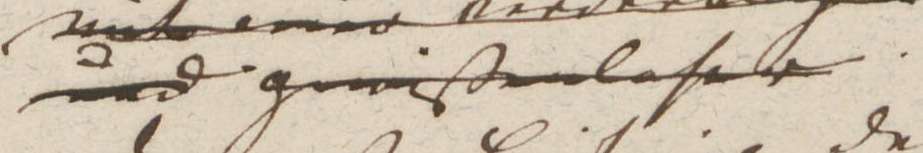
und gewissenloser
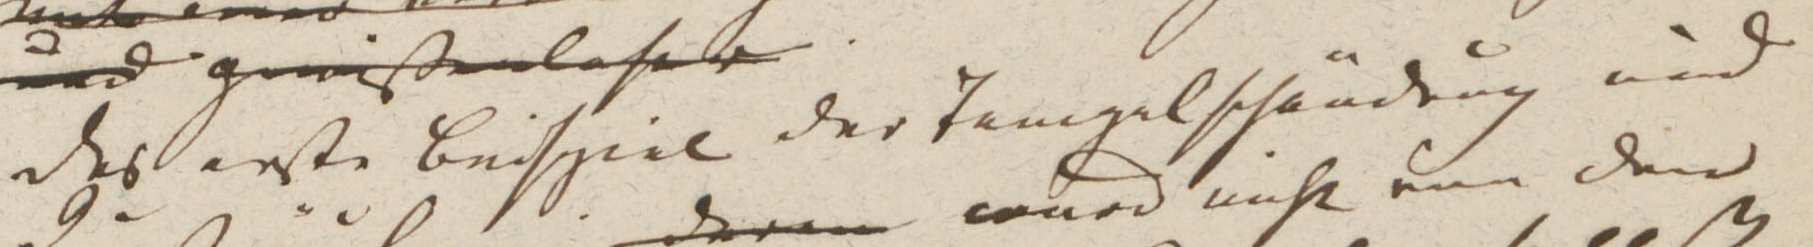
Das erste Beispiel der Tempelschändung und
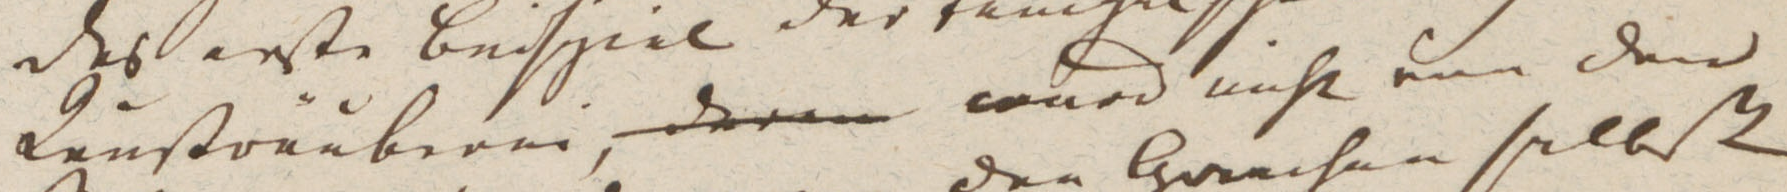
Kunsträuberei, deren wrd nicht von den
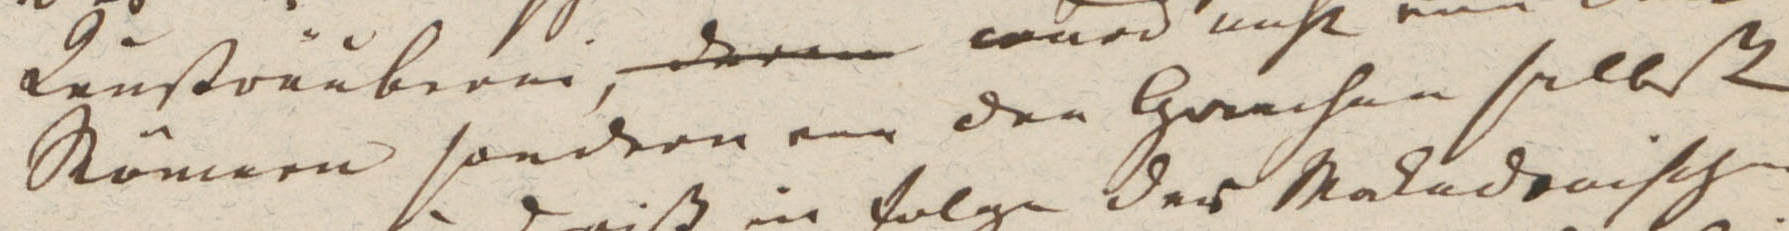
Römern sondern von den Griechen selbst
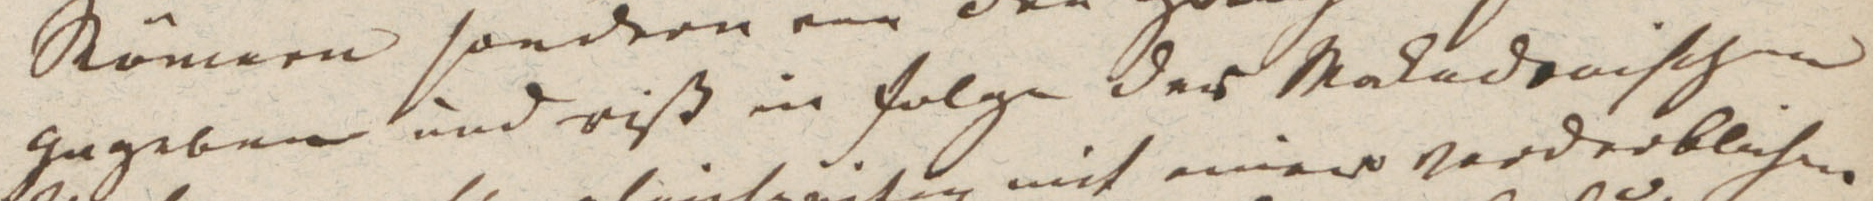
gegeben und riss in Folge der Makedonischen
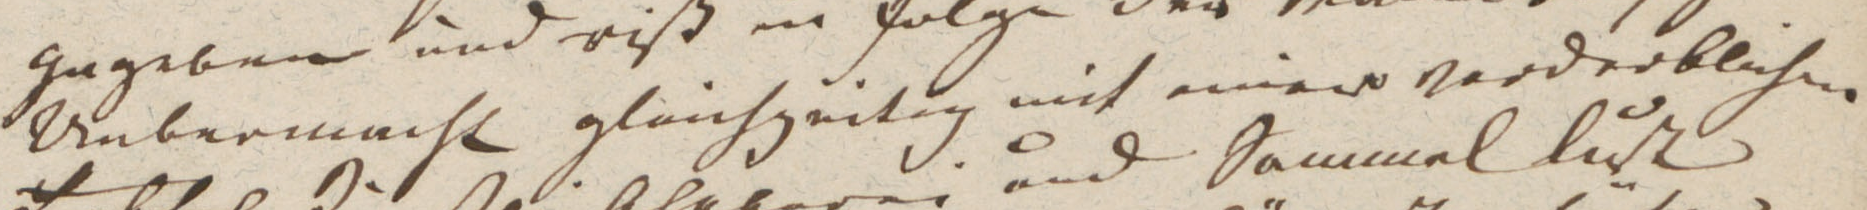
Uebermacht gleichzeitig mit einer verderblichen
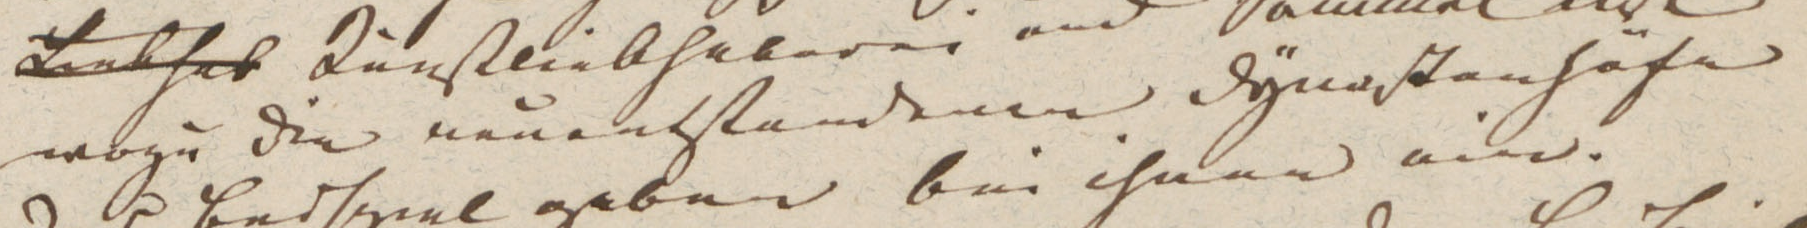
wozu die neuentstandenen Dynastenhöfe
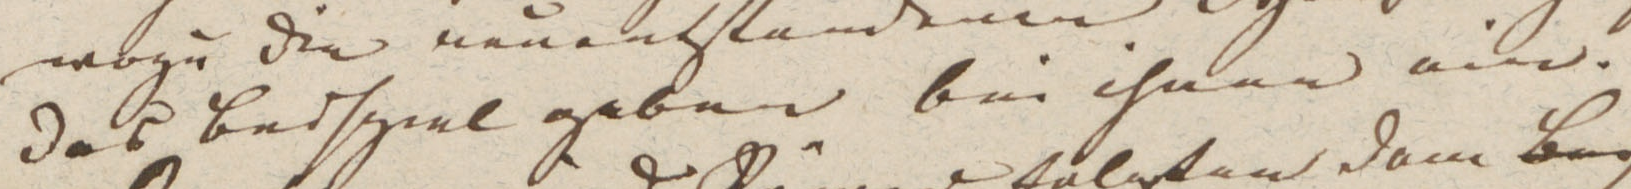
das Beispiel gben bei ihnen ein.
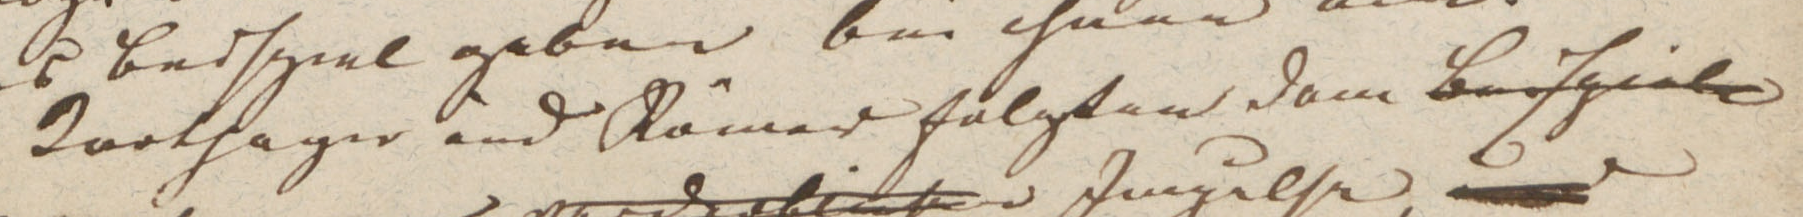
Karthager und Römer folgten dem Beispiele
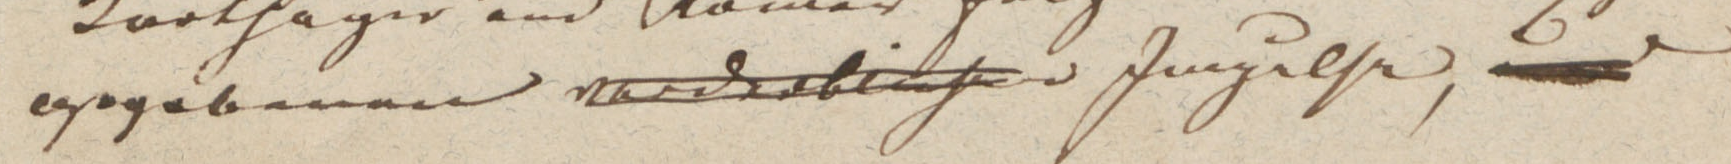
gegebenen verderblicher Impulse, und
